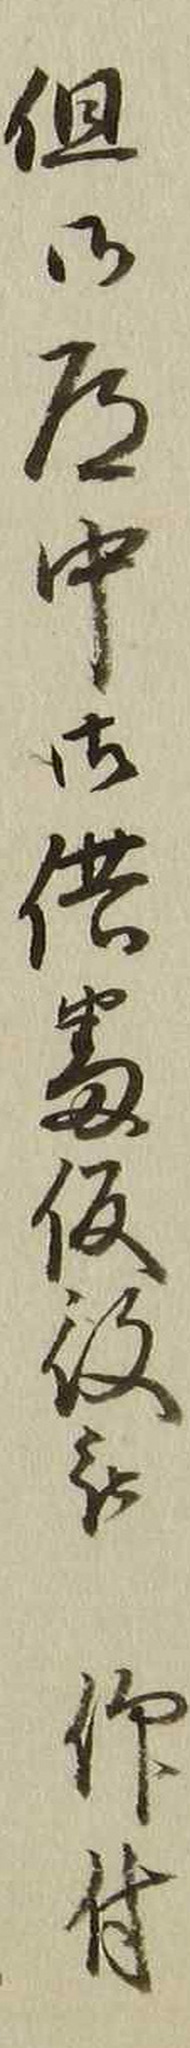但御道中御供番仮役被仰付
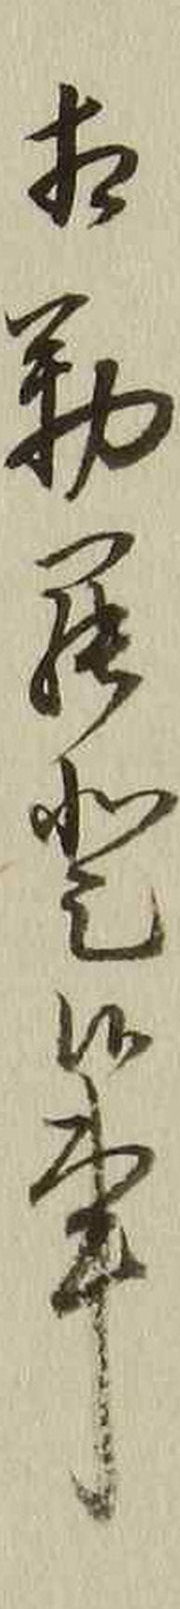相勤罷登候事
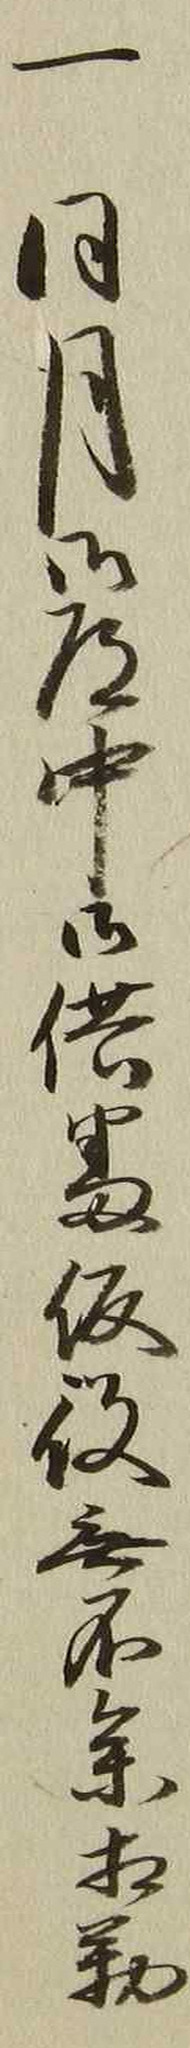一同月御道中御供番仮役無不参相勤
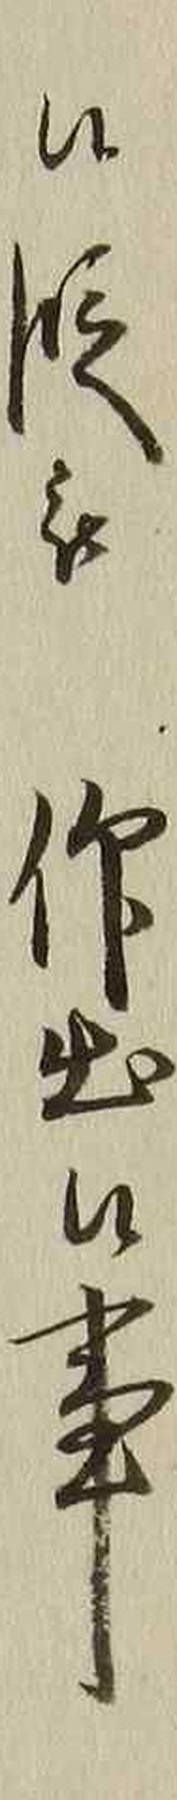候段被仰出候事
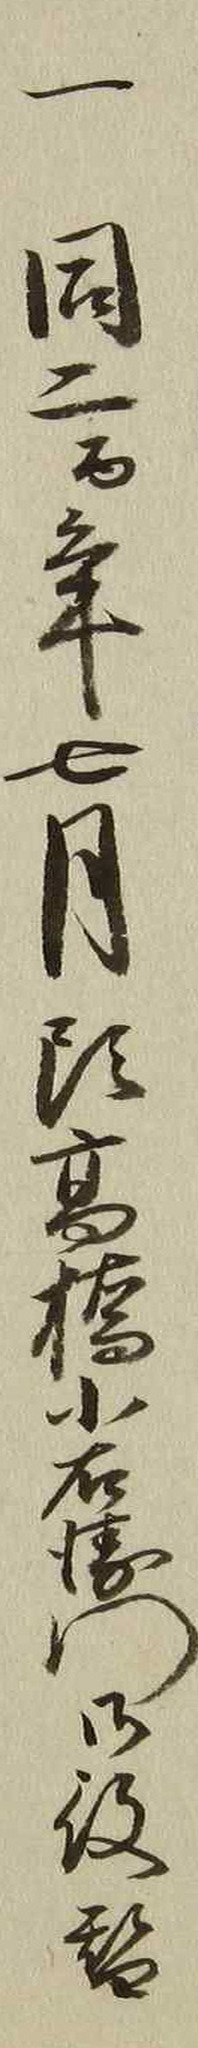一同二酉年七月頭高橋小右衛門御役替
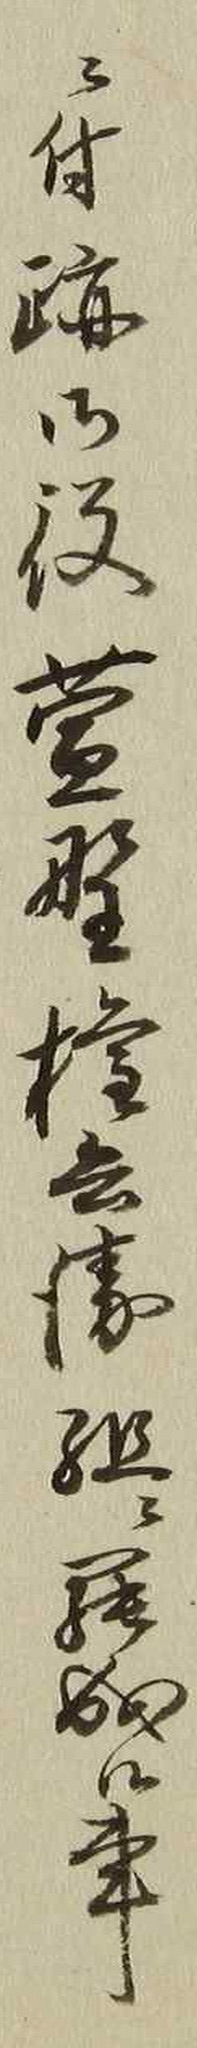に付跡御役萱野権兵衛組に罷成候事
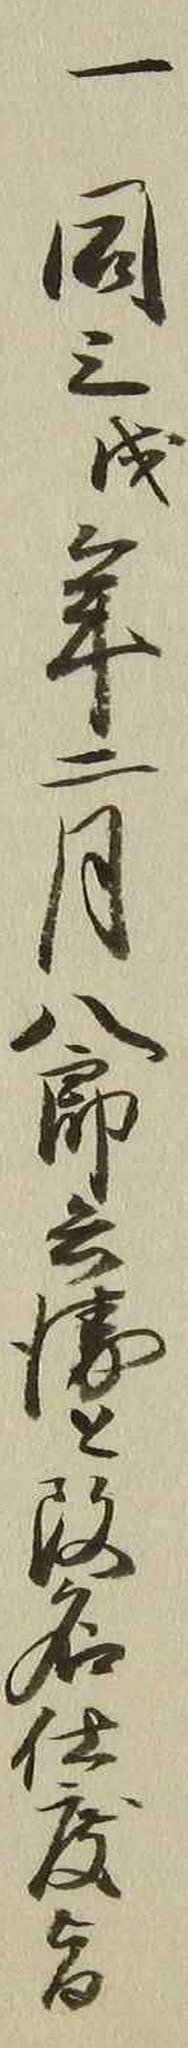一同三戌年二月八郎兵衛と改名仕度旨
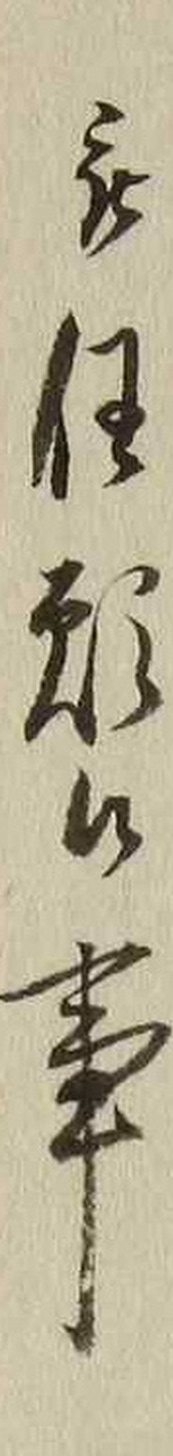被任願候事
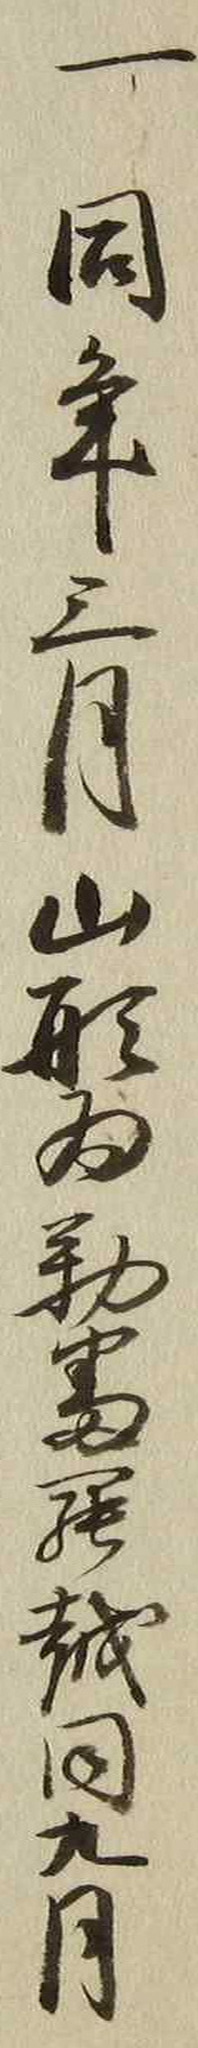一同年三月山形為勤番罷越同九月
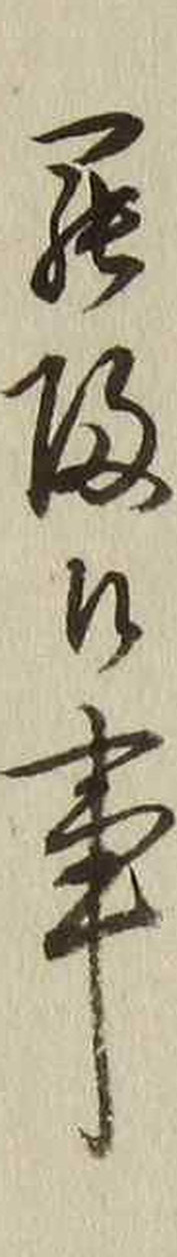罷帰候事
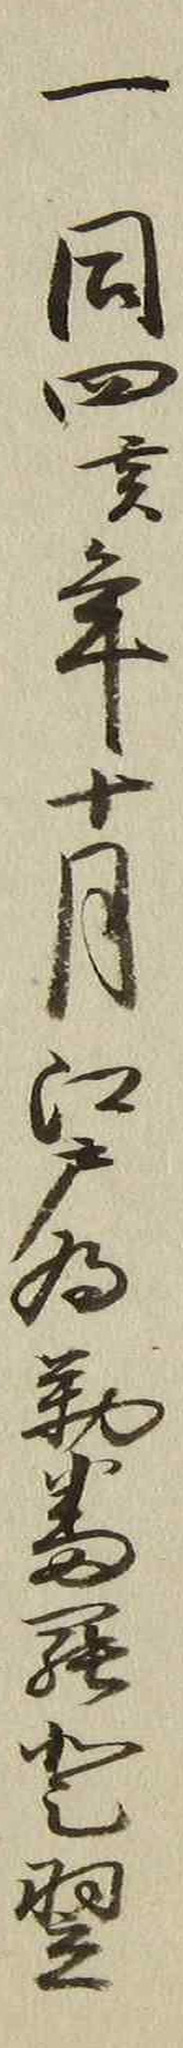一同四亥年十月江戸為勤番罷登翌
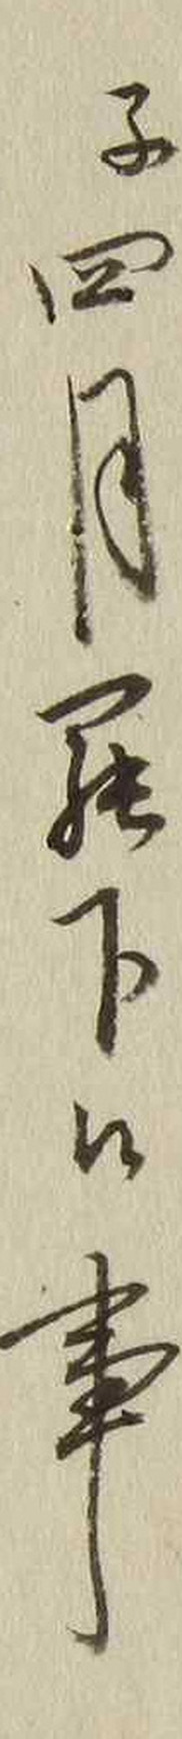子四月罷下候事
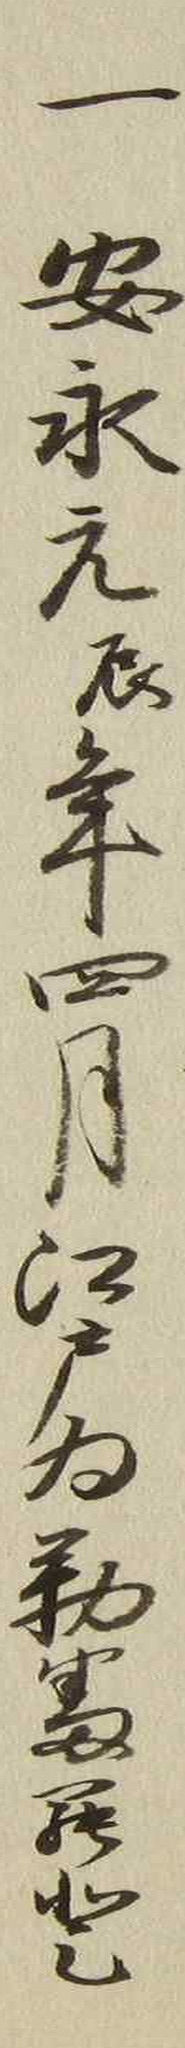一安永元辰年四月江戸為勤番罷登
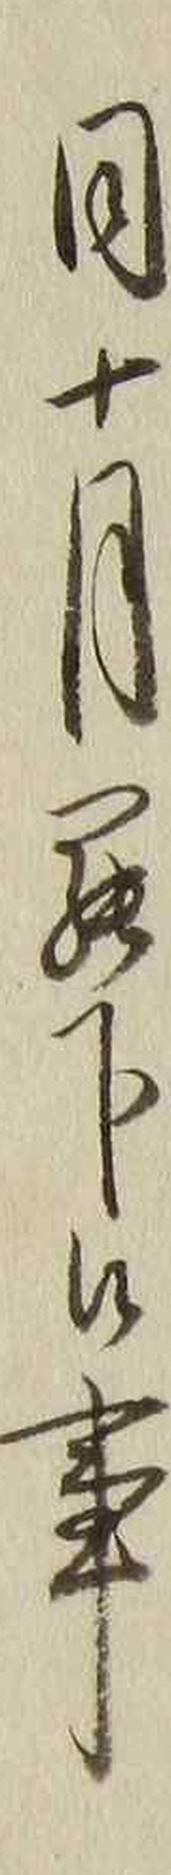同十月罷下候事
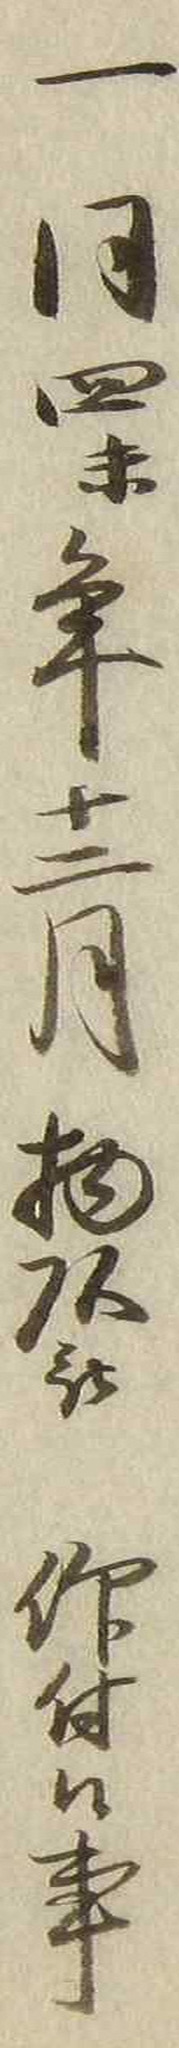一同四未年十二月物頭被仰付候事
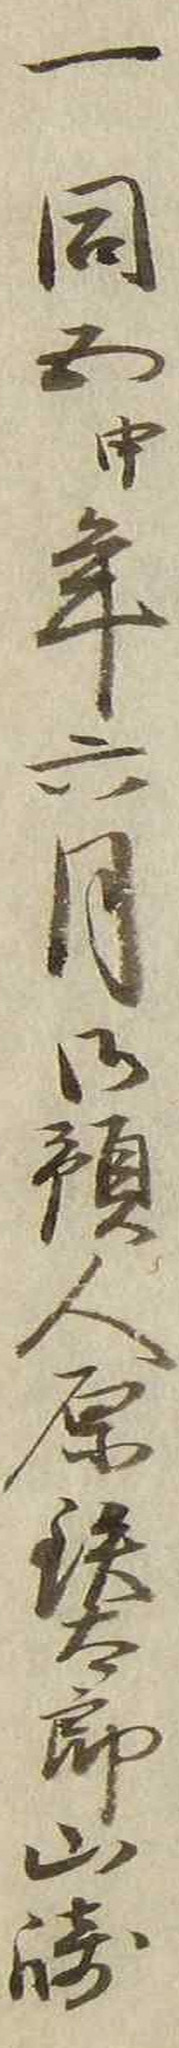一同五申年六月御預人原鉄太郎山崎
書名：諸士系譜　巻之133　た之部9
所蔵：会津若松市立会津図書館
